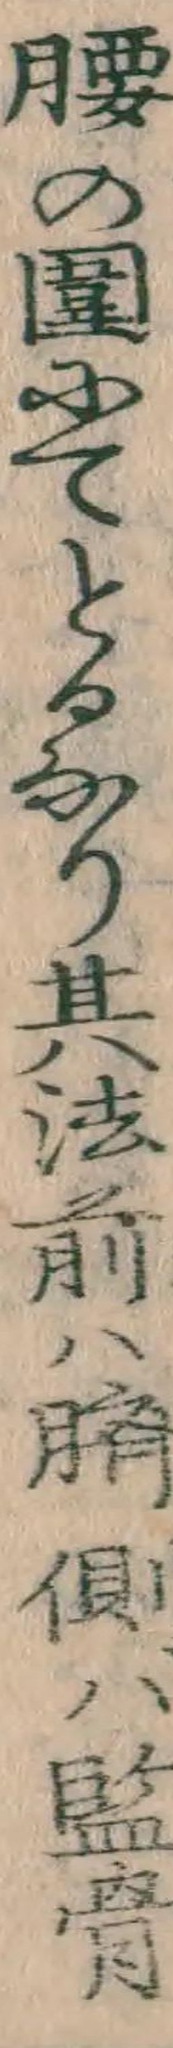腰の囲にてとるなり其法前は臍側は監骨
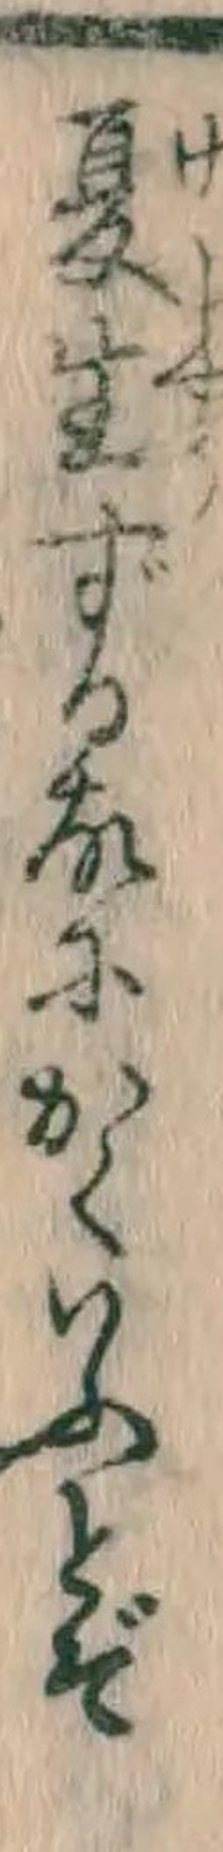夏生ずる故にかくいふとぞ
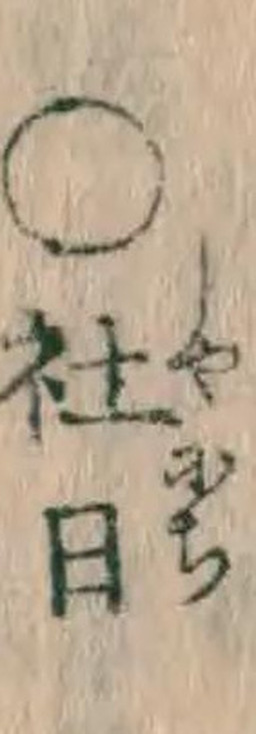○社日
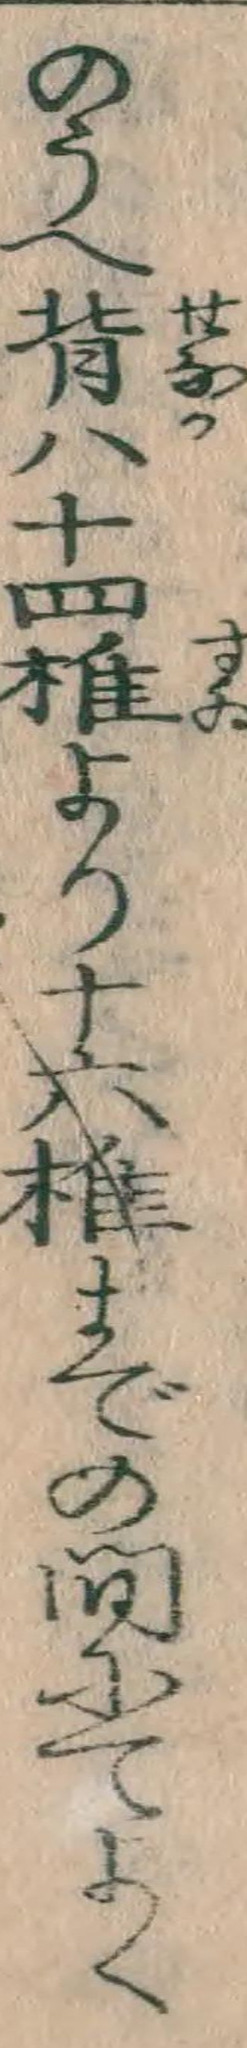のうへ背は十四椎より十六椎までの間にてよく
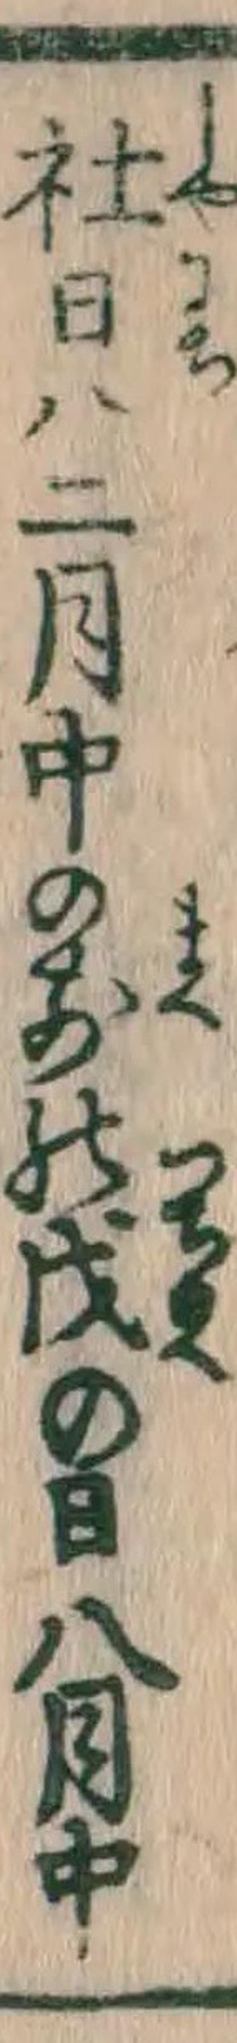社日は二月中の前の戊の日八月中
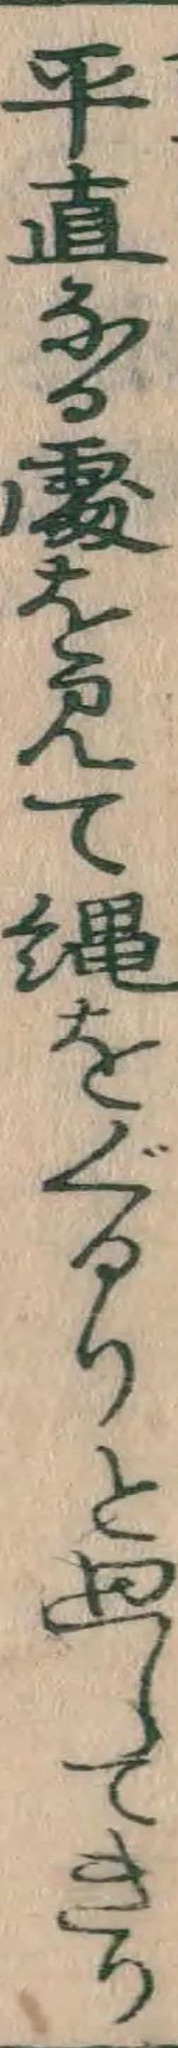平直なる処を見て縄をぐるりと廻してきり
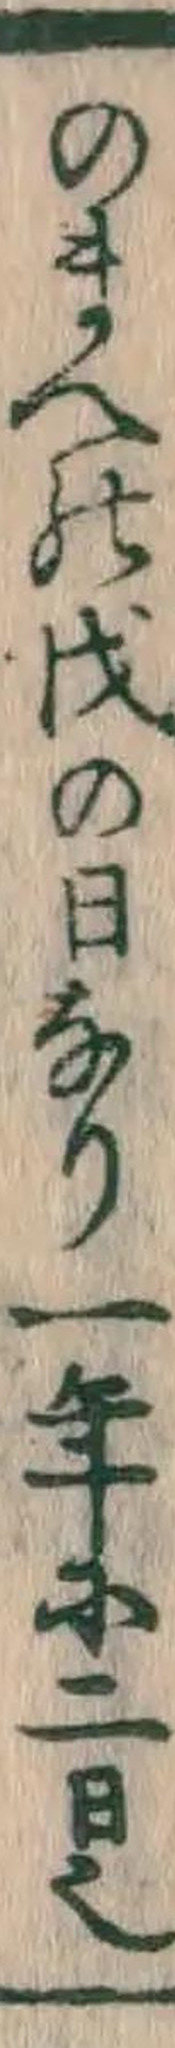のまへの戊の日なり一年に二日也
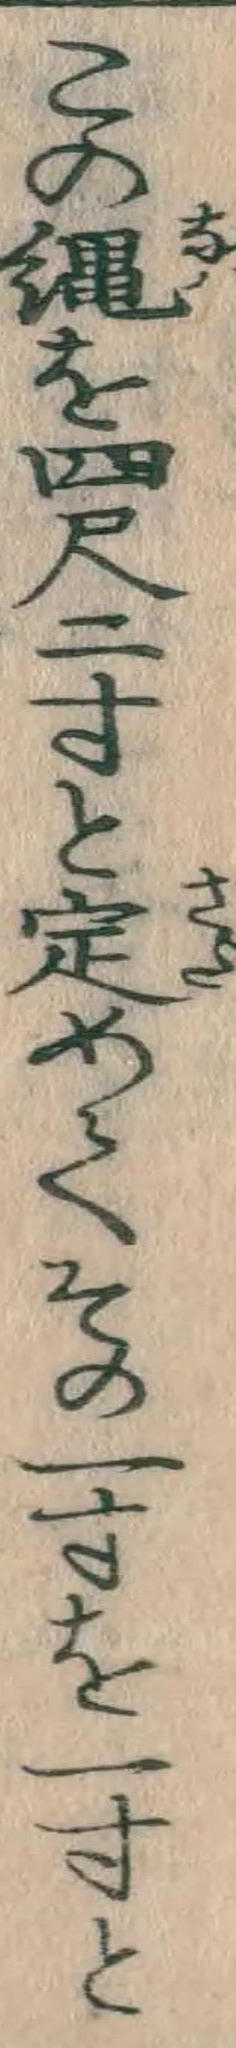この縄を四尺二寸と定めてその一寸を一寸と
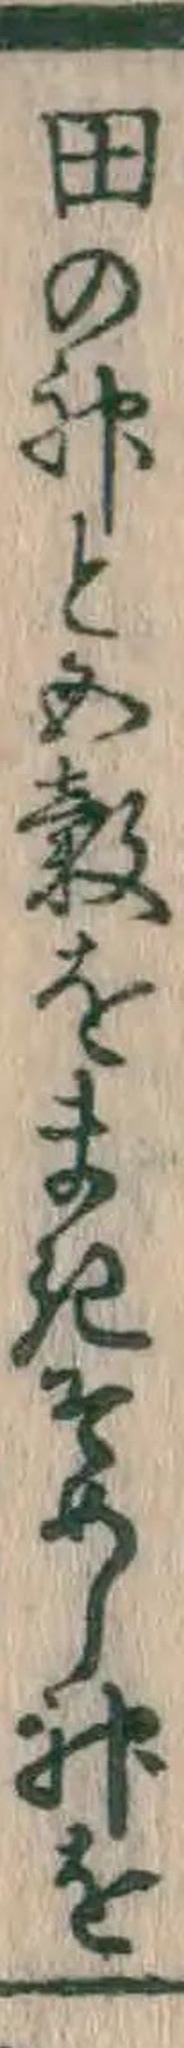田の神と五穀をまきそめし神を
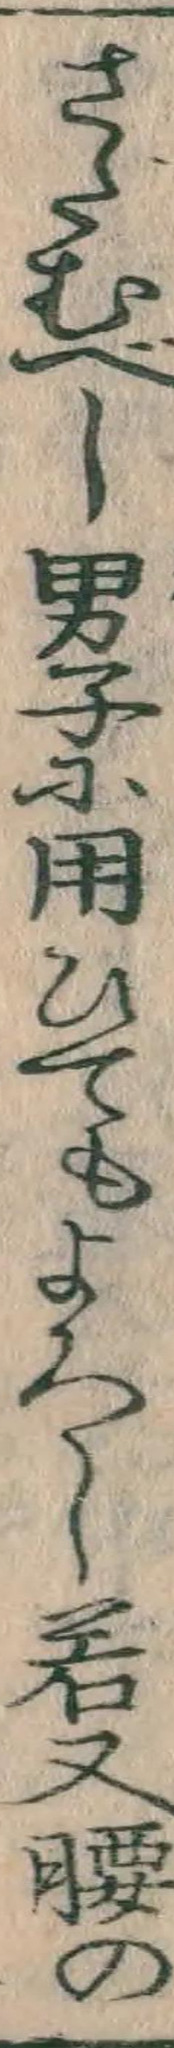さたむべし男子に用ひてもよろし若又腰の
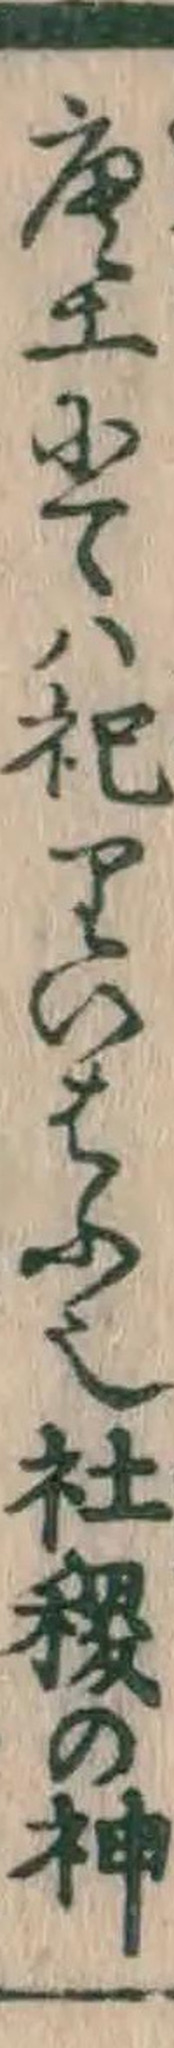唐土にて祀りいはふ也社稷の神
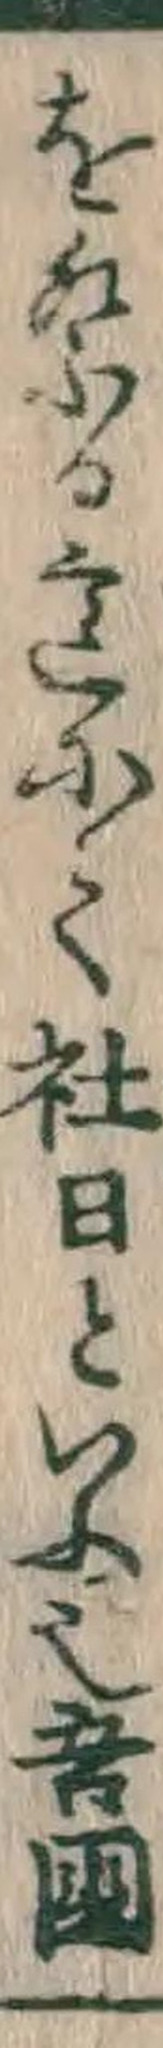を祭る意にて社日といふ也吾国
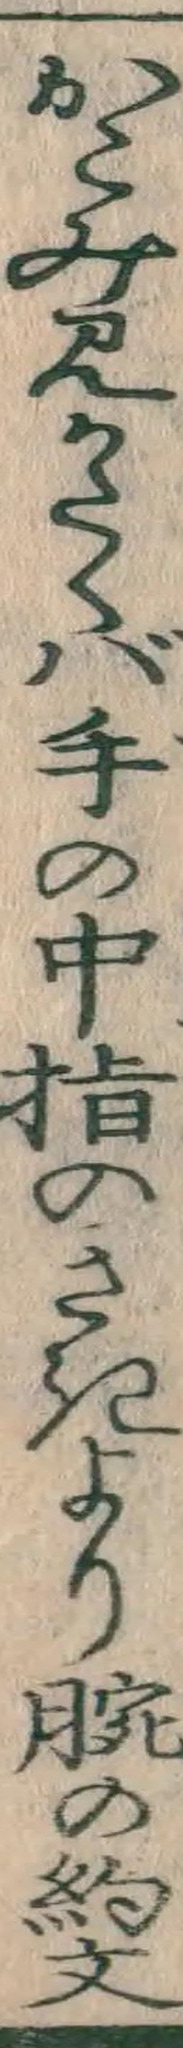かこみ見かたくば手の中指のさきより腕の約文
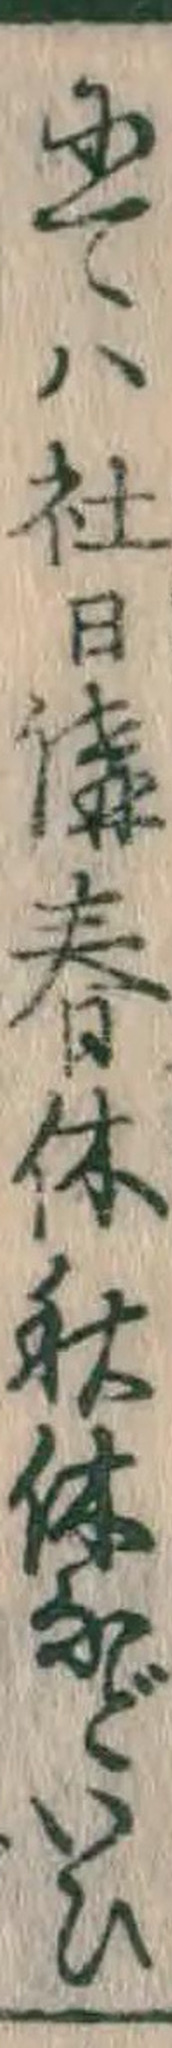にては社日講春休秋休などいひ
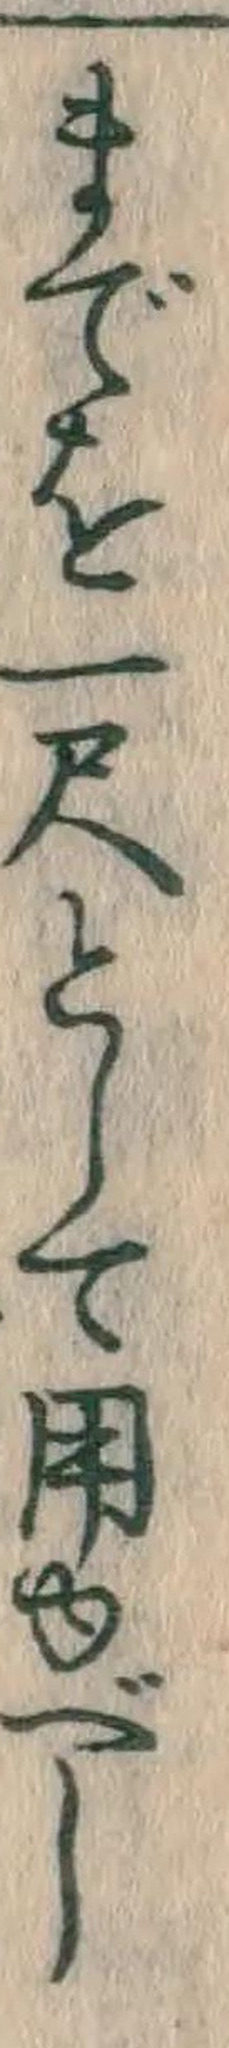までを一尺として用ゆべし
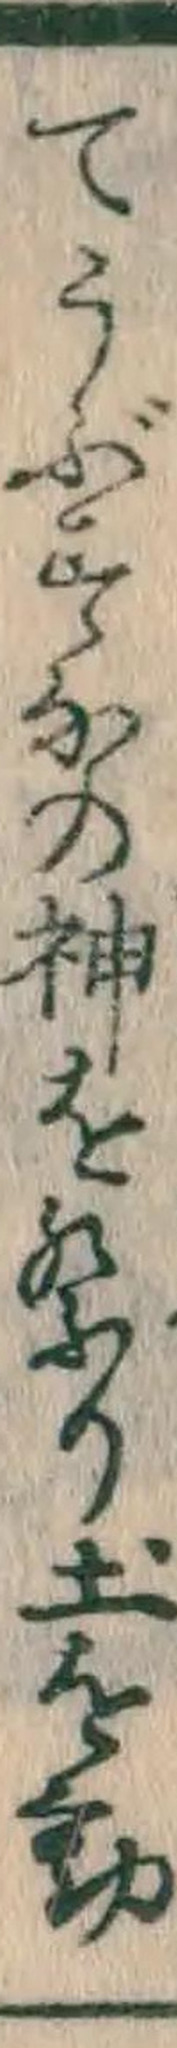てうぶすなの神を祭り土を動
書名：広益秘事大全 3巻. [4]
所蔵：国立国会図書館 National Diet Library, JAPAN
